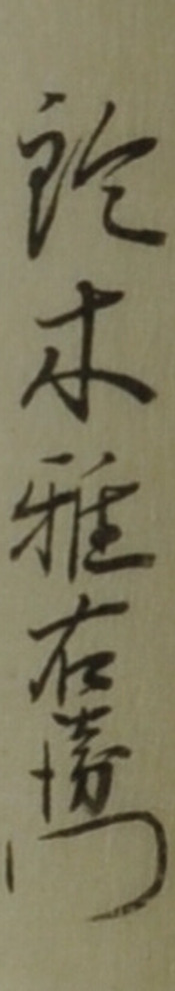鏑木雅右衛門
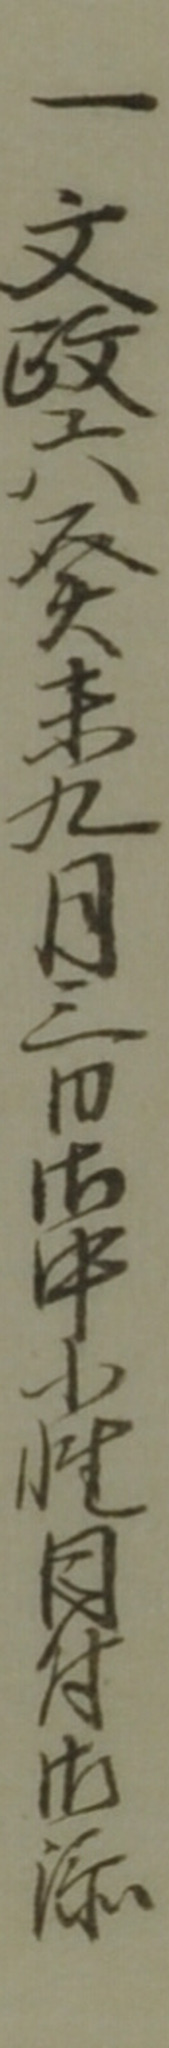一文政六癸未九月三日御中小性目付御添
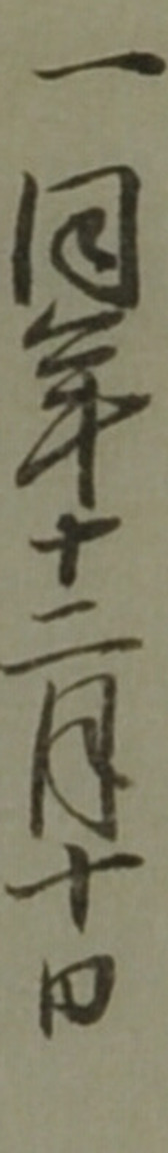一同年十二月十日
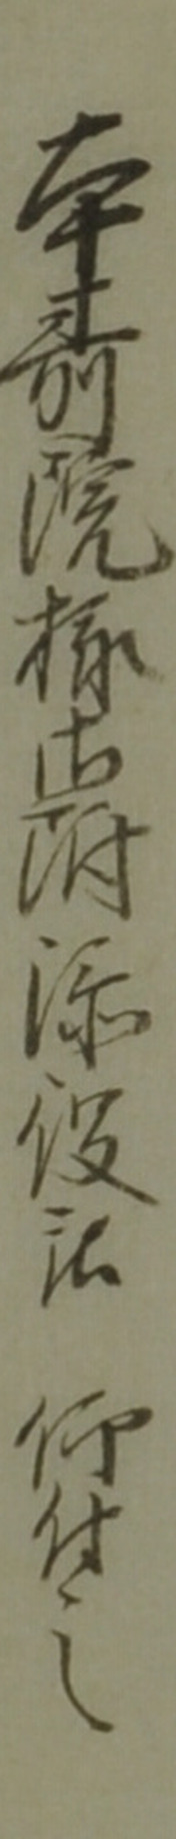本寿院様御附添役被仰付之
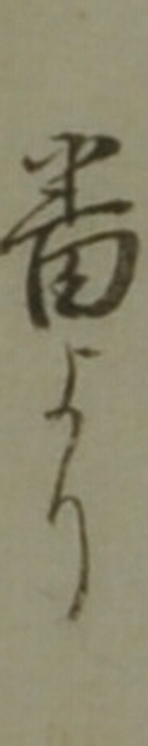番より
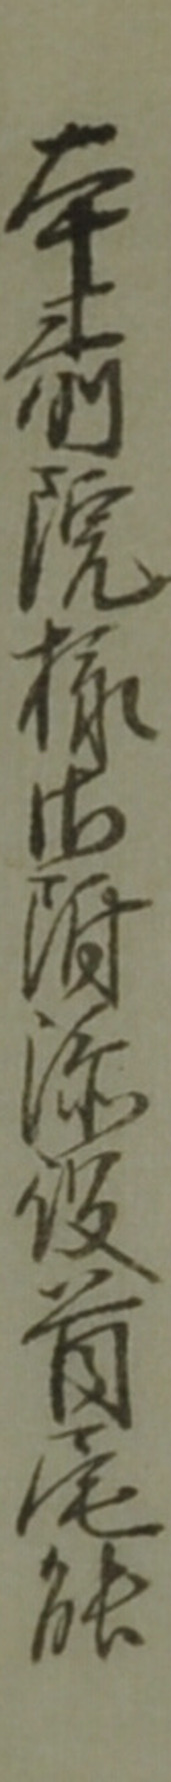本寿院様御附添役首尾能
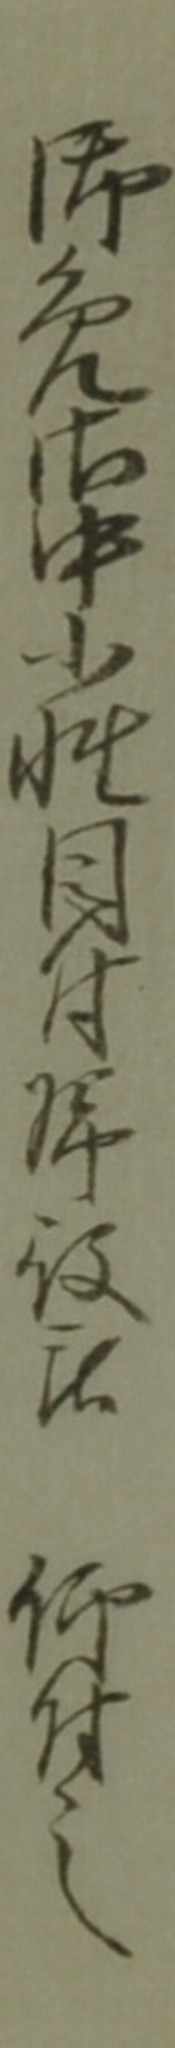御免御中小性目付帰役被仰付之
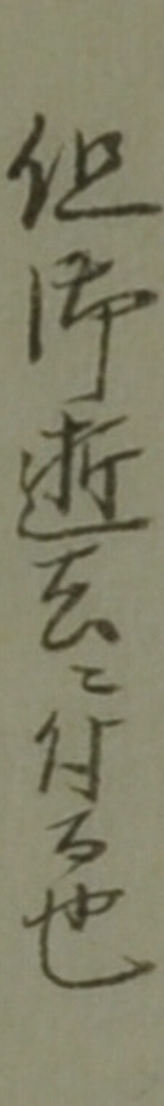但御逝去ニ付而也
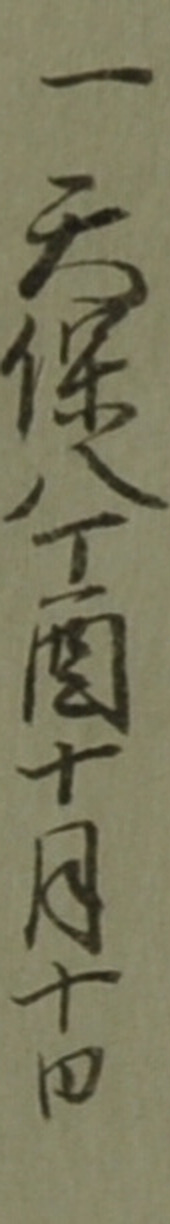一天保八丁酉十月十日
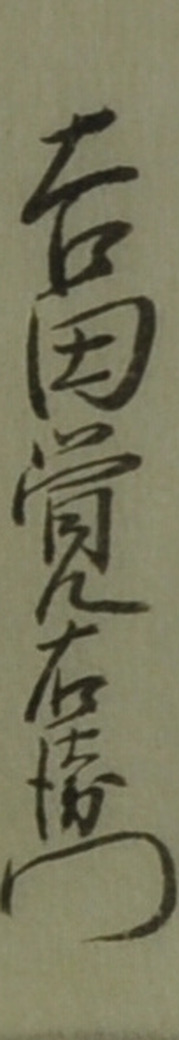吉田覚右衛門
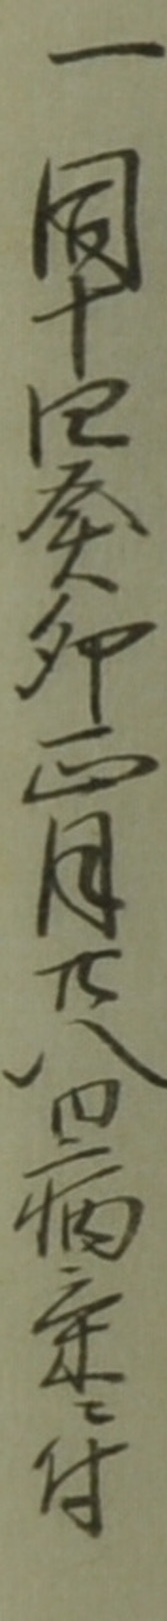一同十四癸卯正月廿八日病気ニ付
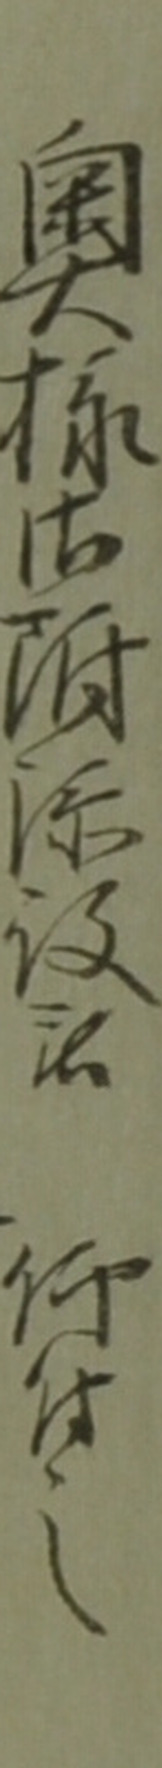奥様御附添役被仰付之
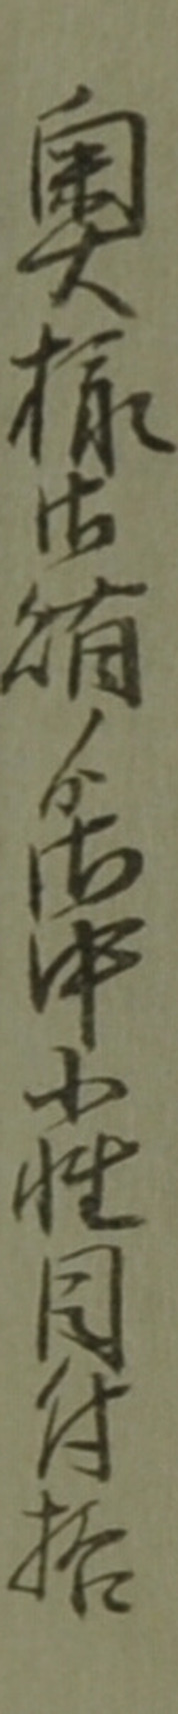奥様御賄ゟ御中小性目付格

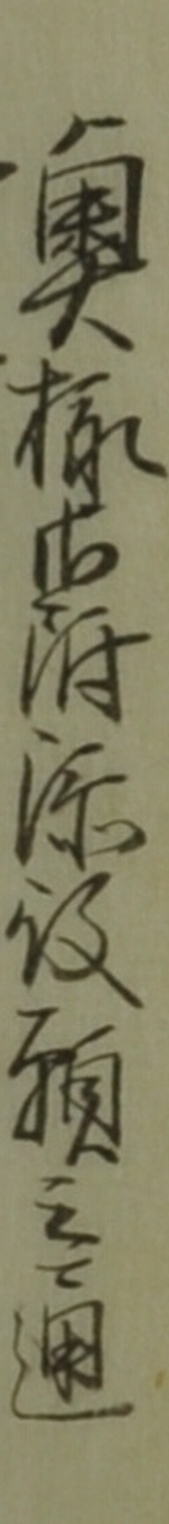奥様御附添役願之通
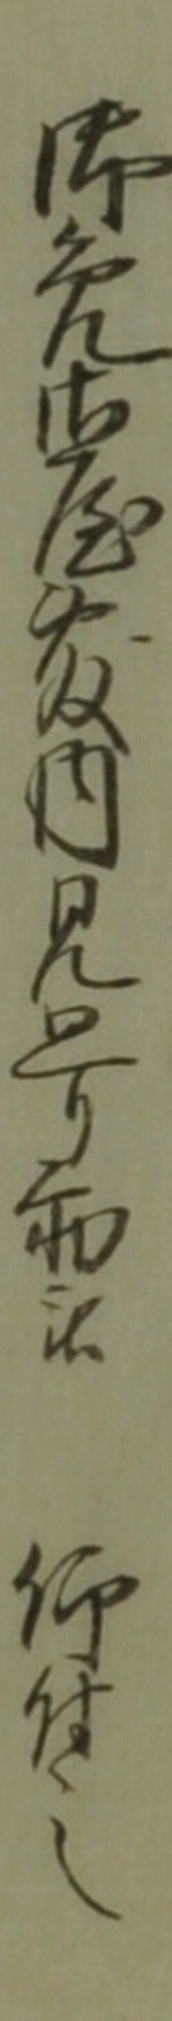御免御屋敷内見廻り勤被仰付之
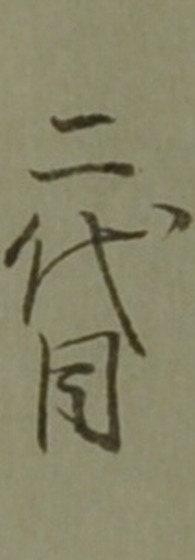二代目
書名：諸御役代々録（六）
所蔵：伊那市立高遠町図書館・合同会社AMANE
